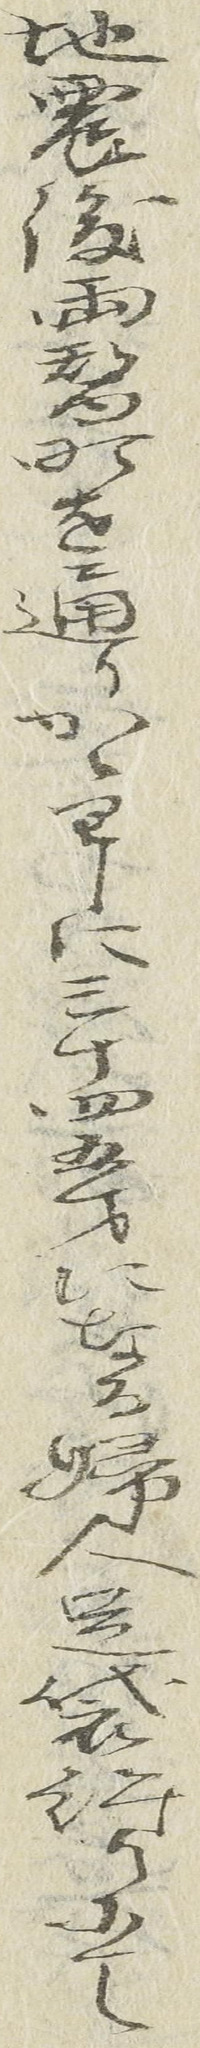地震後両替町を通りかゝりしに三十四五才になる婦人足袋許りにて
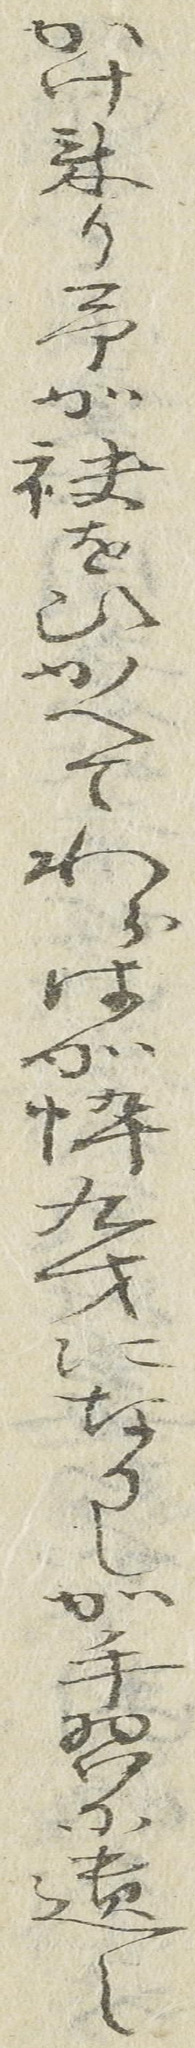かけ来り予が袂をひかへてわらはが忰九才になりしが手習に遺し
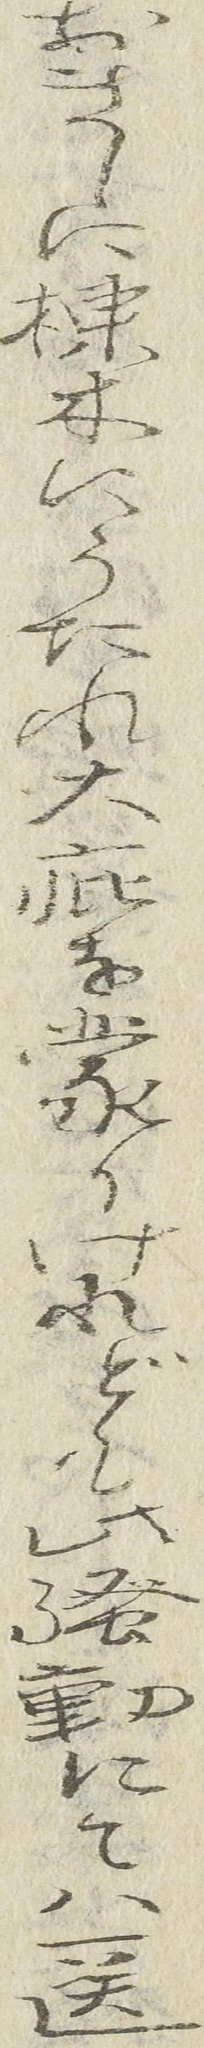おきしに棟木にうたれ大疵を蒙りけれども此騒動にては医

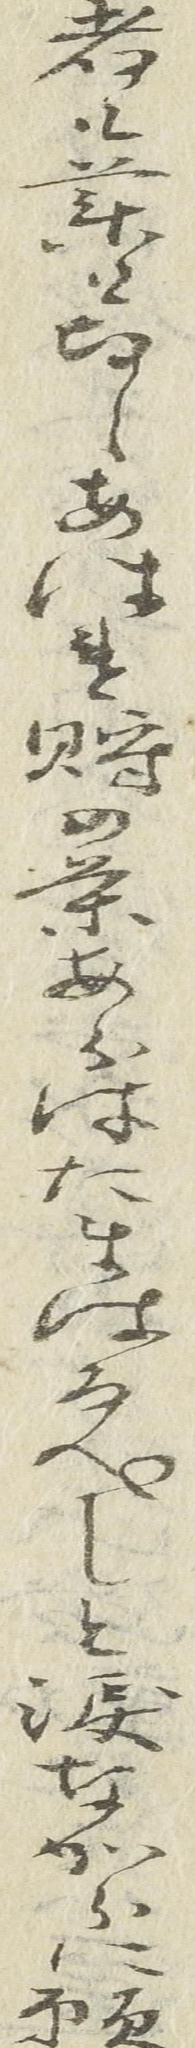者も薬もなしあはれ貯の薬あらはたまはるべしと涙なからに頼
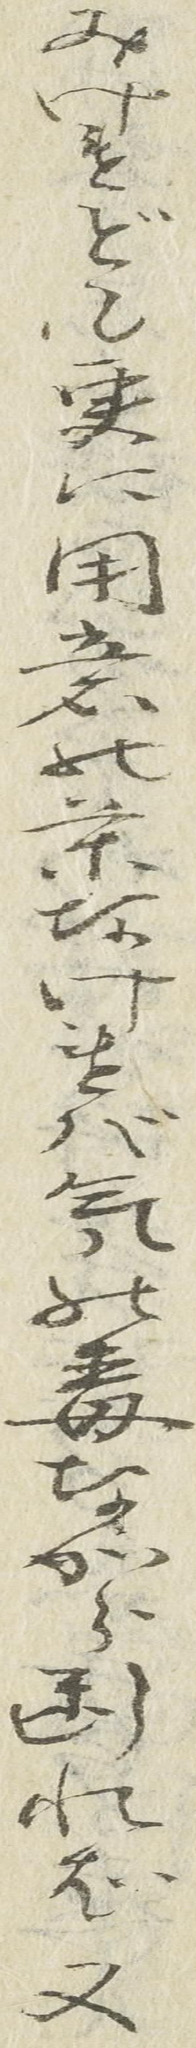みけれども更に用意の薬なけれバ気の毒なから断れば又
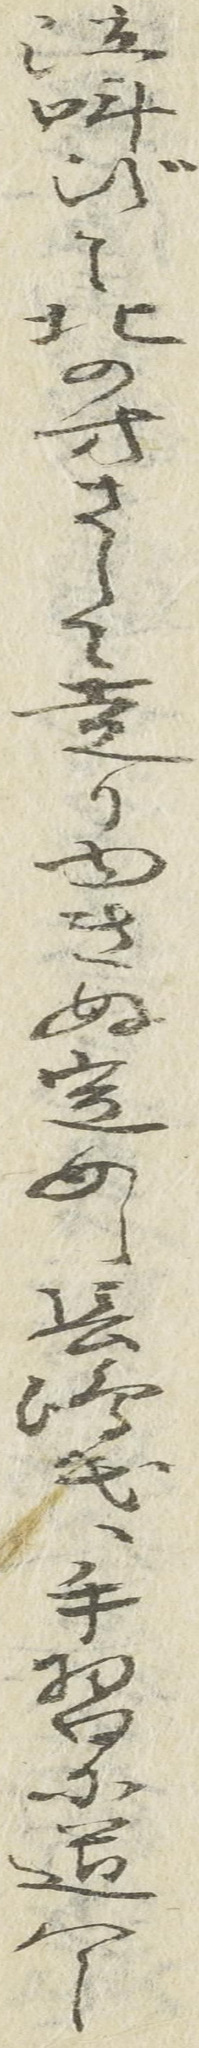泣叫びて北の方さして走りゆきぬ定めし長嶋氏へ手習に道ハし
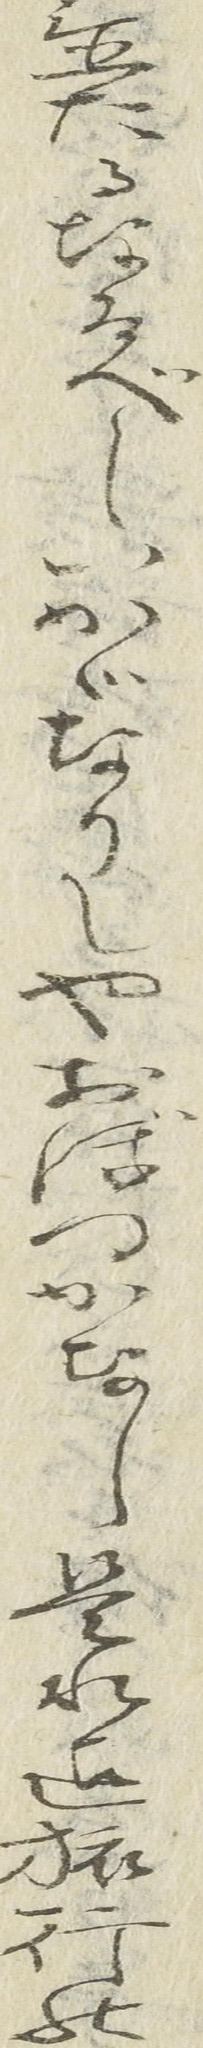置きたるなるべしいかゞなりしやおぼつかなし是れ迄旅行の
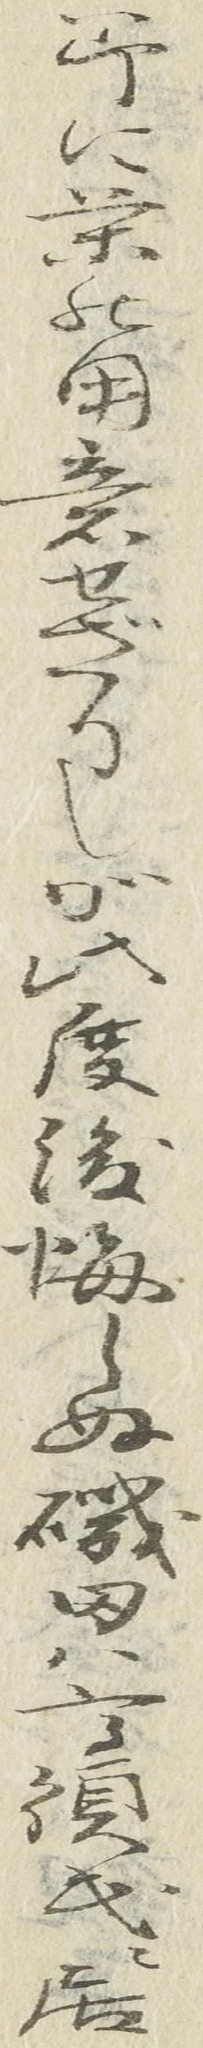節に薬の用意せざりしが此度後悔しぬ磯田ハ高須氏ニ居
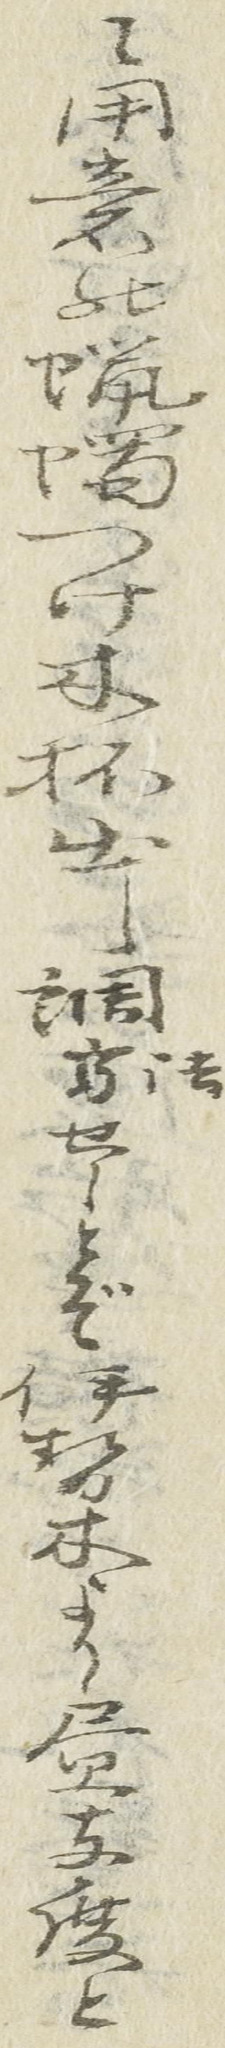て用意の蝋燭つけ木抔出し調方せしとぞ伊勢木より昼支度と
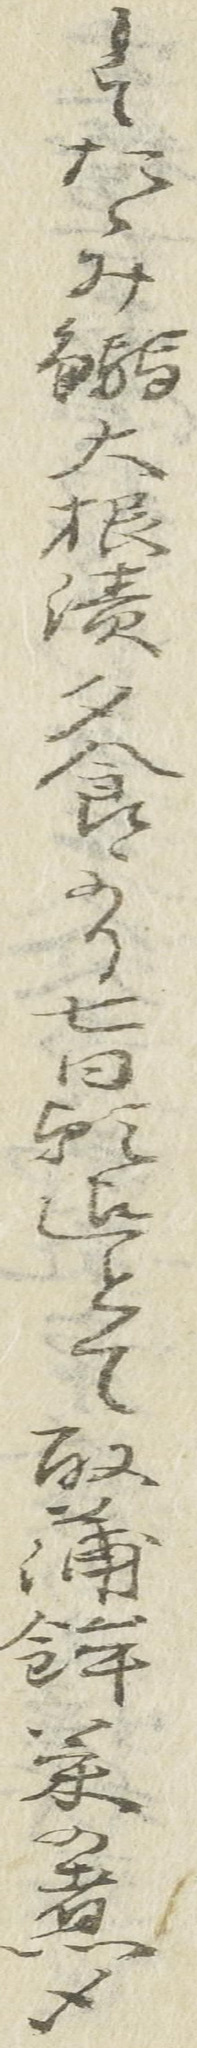してたゝみ鰯大根漬夕食より七日朝迄とて取蒲鉾菜の煮〆
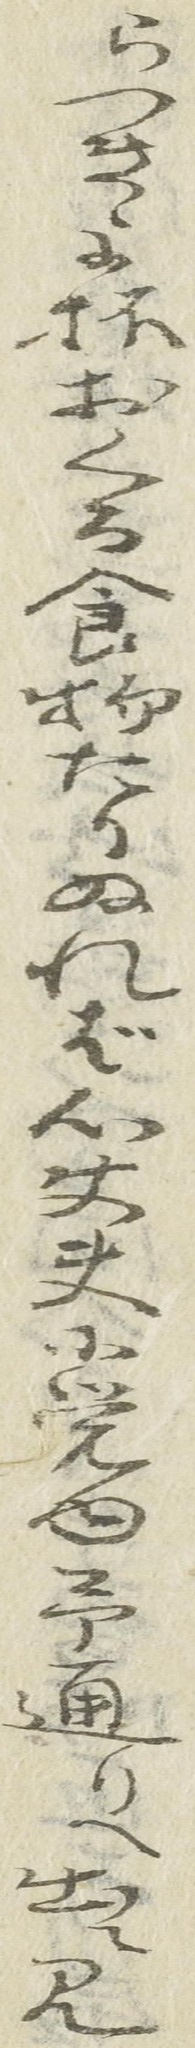らつきよ抔おくる食物たりぬれば心丈夫に覚ゆ予通りへ出て見
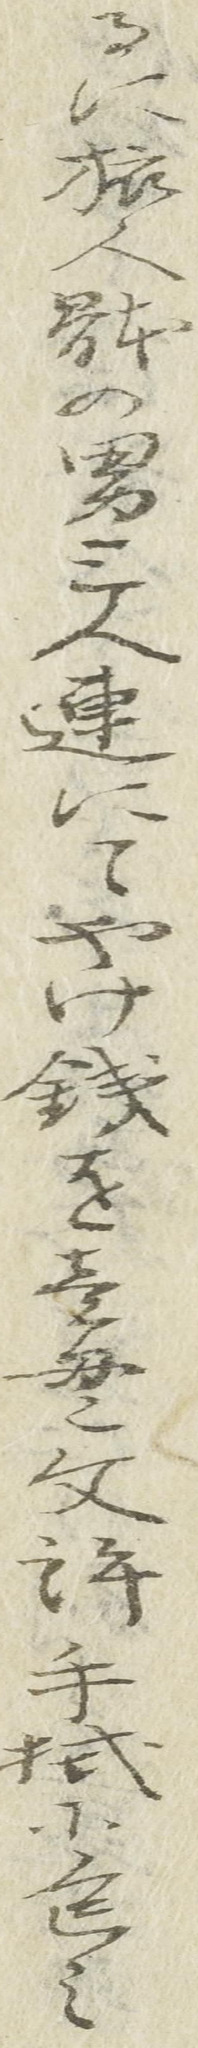るに旅人躰の男三人連にてやけ銭を壱貫文許手拭に包み
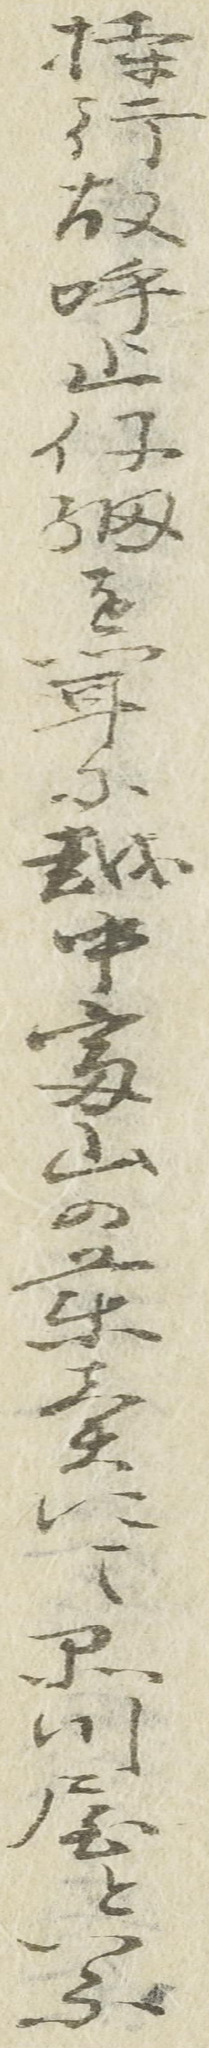持行故呼止仔細を聞に越中富山の薬売にて品川屋といふ
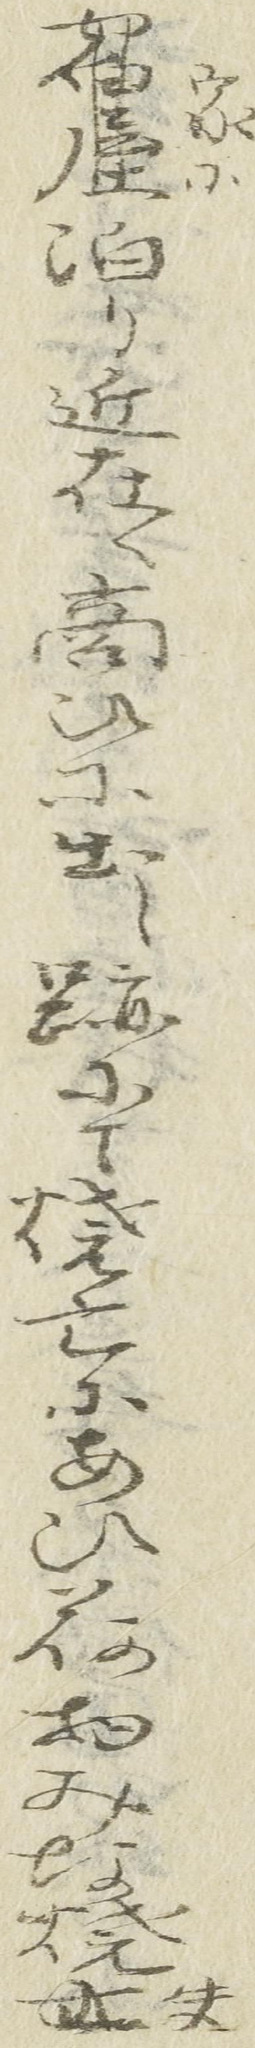宿屋泊り近在へ商ひに出し跡にて焼亡にあひ荷物みな焼亡
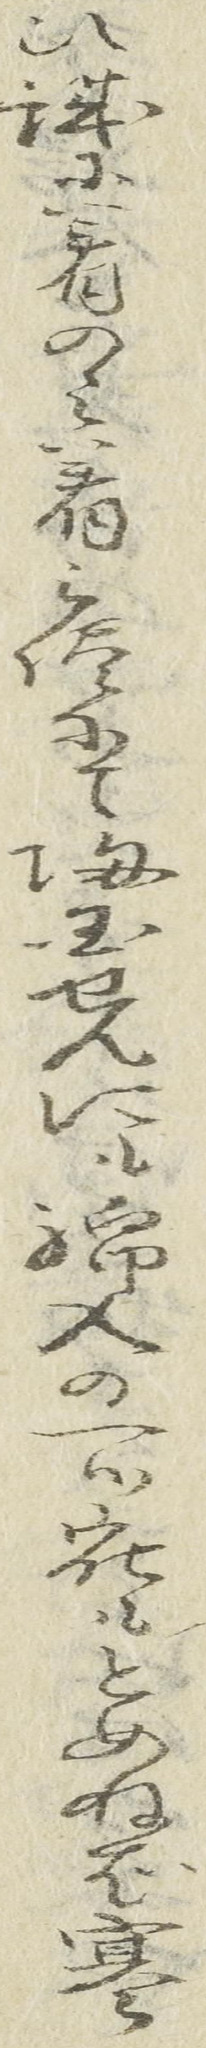ひ誠に着のみ着之儘にて帰国せんにも綿入の一ツ宛もとめねば寒
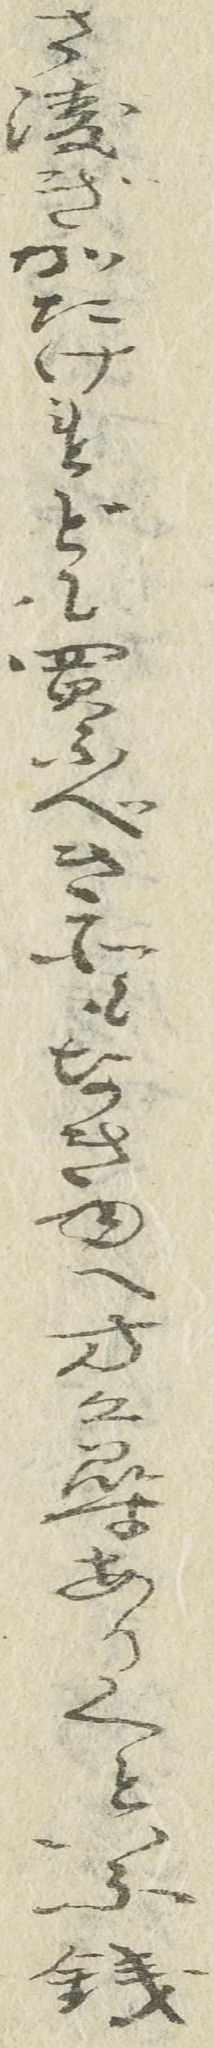さ凌ぎかたけれども買ふべき所もなきゆへ方々尋ありくといふ銭
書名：地震前兆集　全
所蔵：東京大学地震研究所図書室 Earthquake Research Institute Library, The University of Tokyo, JAPAN
